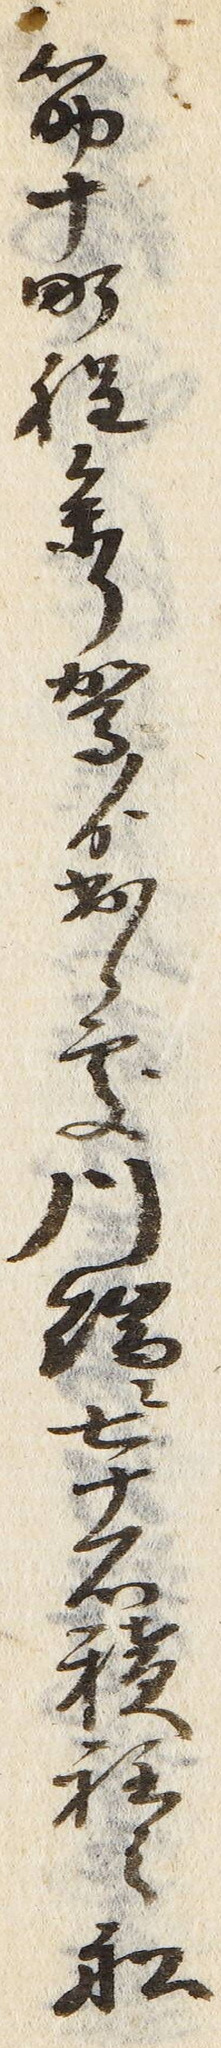筋十町程参り駕ゟ出候處川端ニ七十石積程之舩
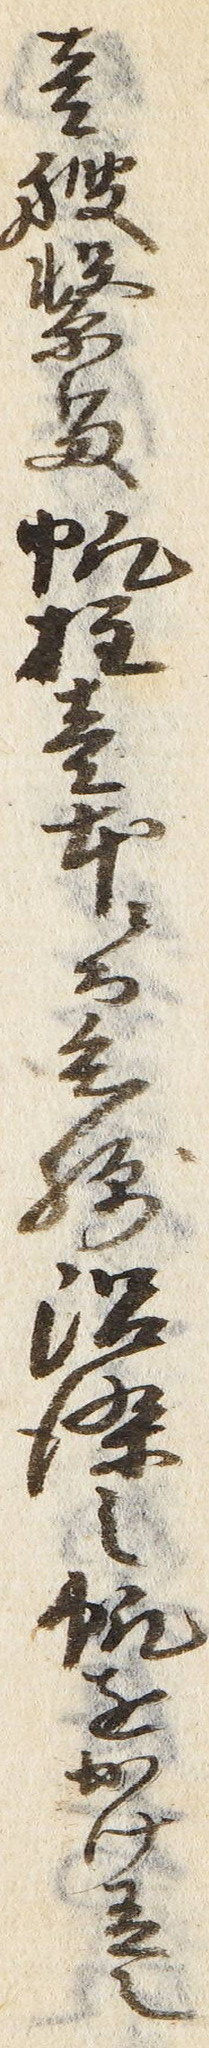壱艘繋留帆柱壱本ニ而毛綿沼染之帆をかけ有之
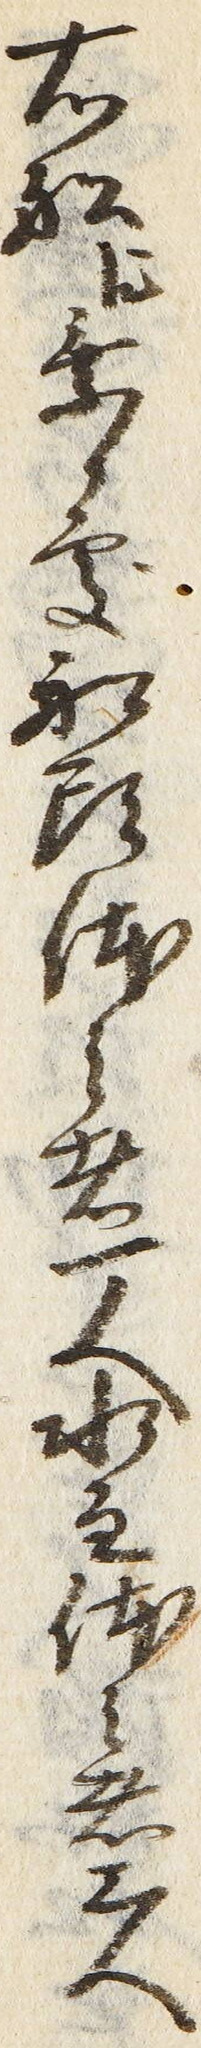右舩江乗候處舩頭体之者一人水主体之者三人
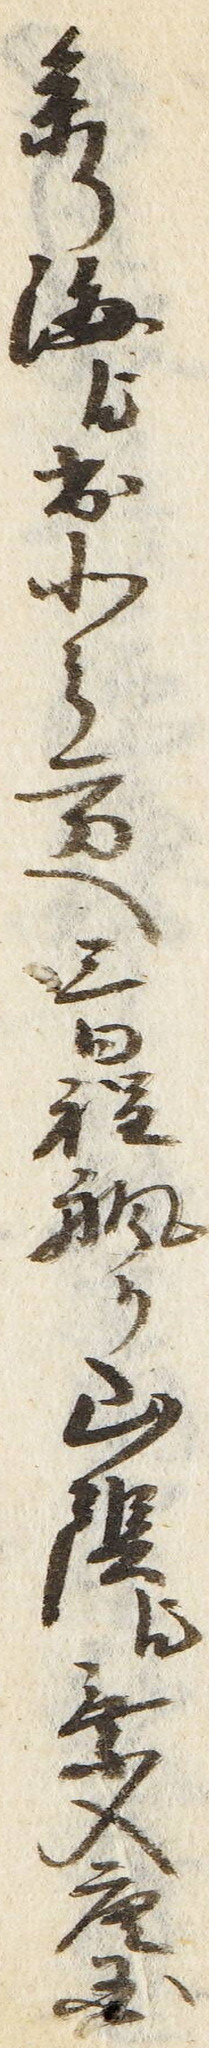参り海江出北之方へ三日程䑺り山陰江乗入唐国
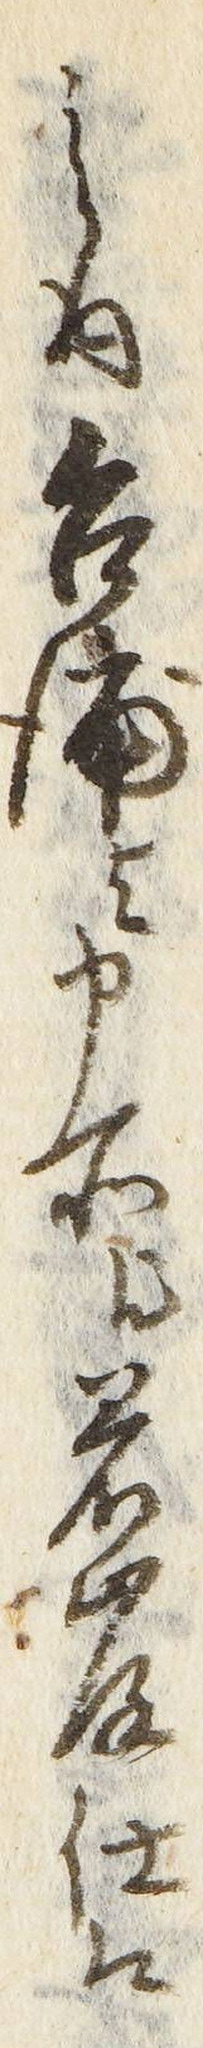之内乍浦と申所江着岸仕候
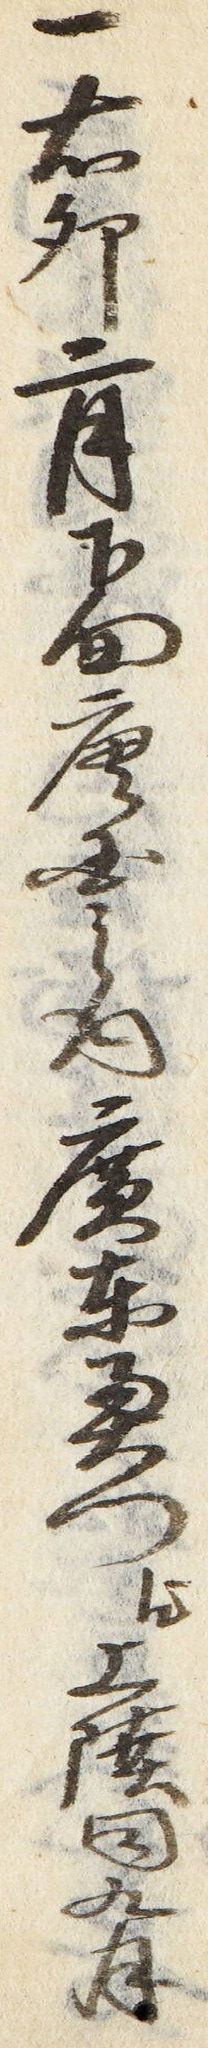一右卯二月下旬唐国之内廣東奥門江上陸同九月

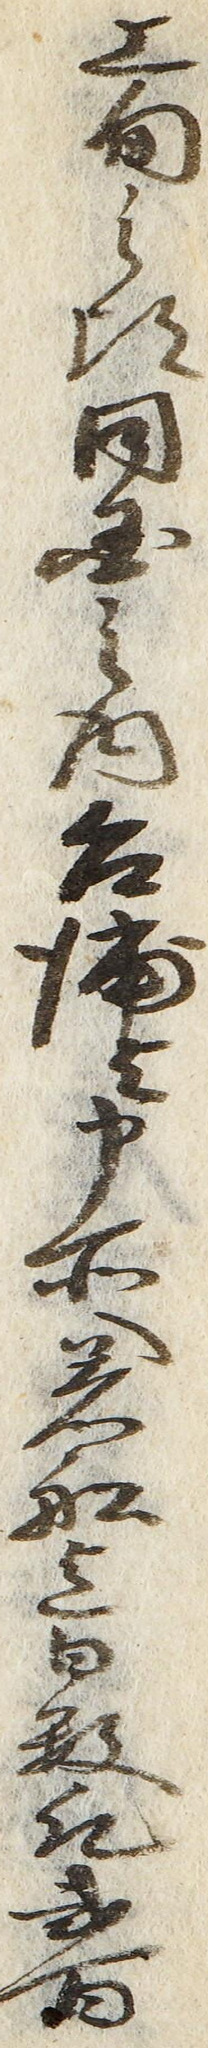上旬之比同国之内乍浦と申所へ着舩迄日数弐百
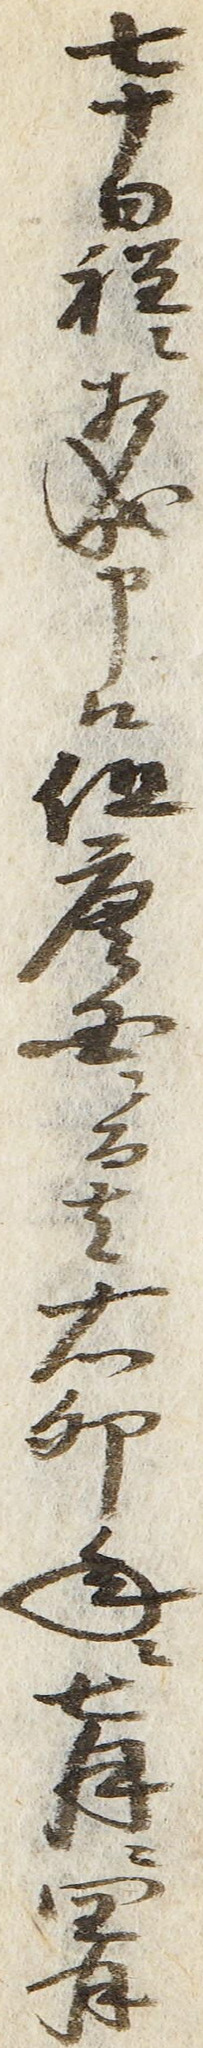七十日程ニ相成申候但唐国ニ而者右卯年二七月ニ閏月
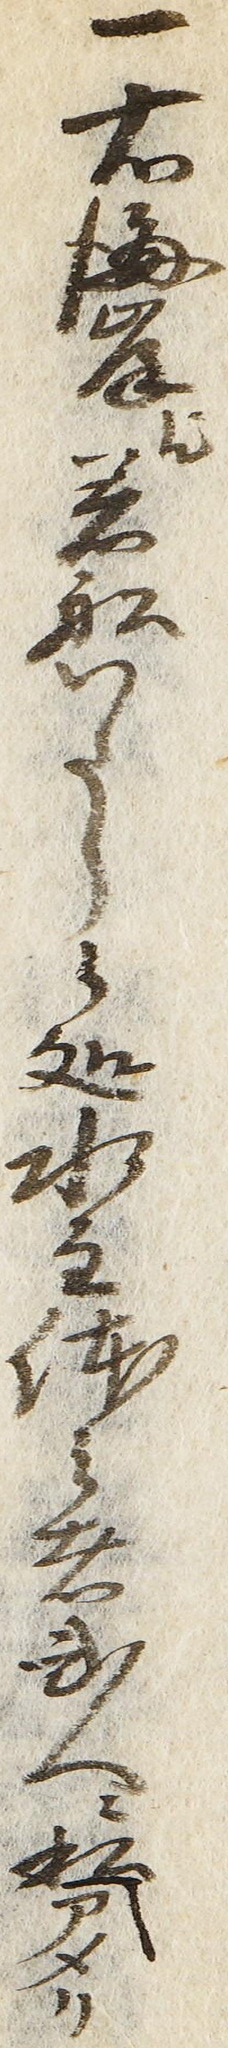一右海岸江着舩いたし候処水主体之者弐人ニ私アメリ
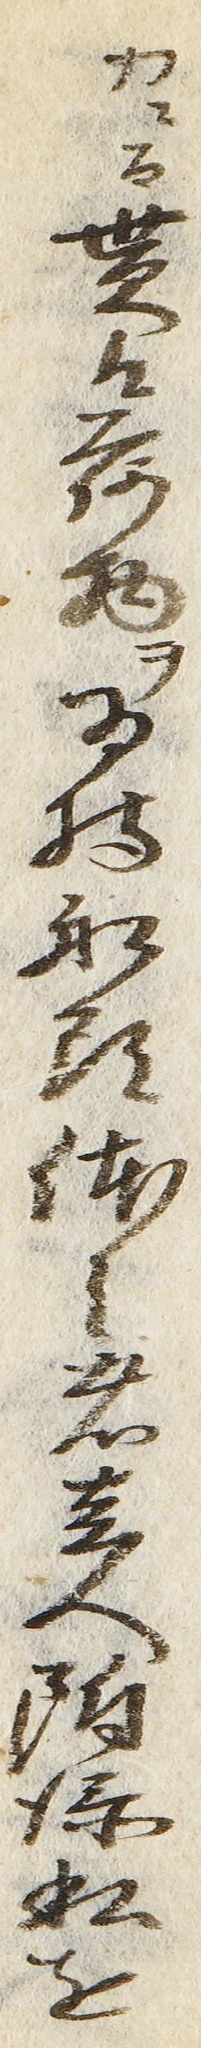カニ而貰候荷物ヲ為持舩頭体之者壱人附添私を
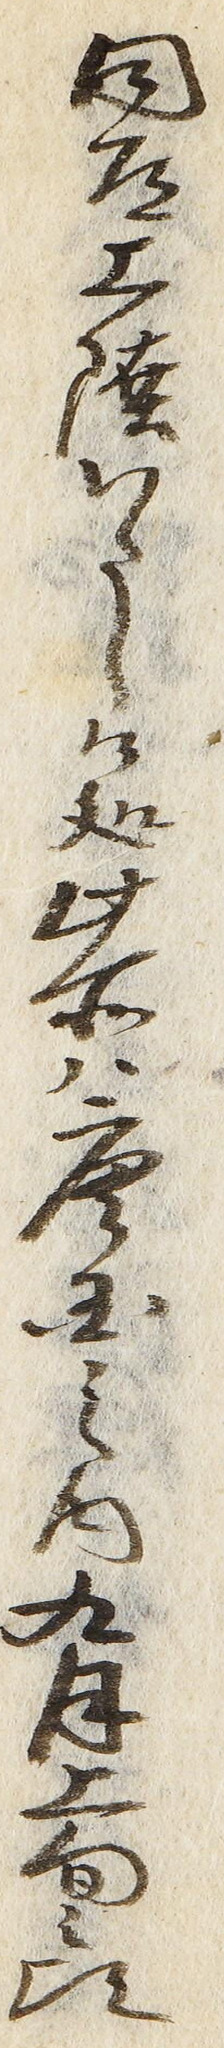同道上陸いたし候処此所ハ唐国之内九月上旬之比
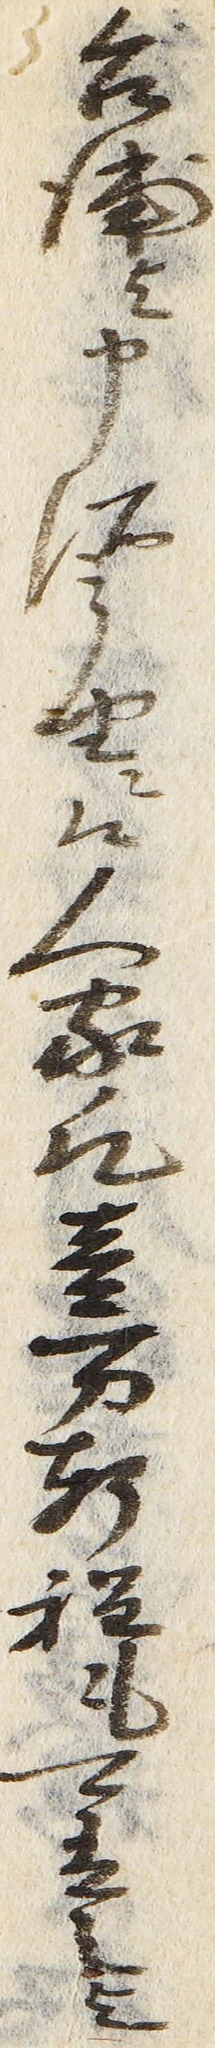乍浦と申所之由ニ候人家凡壱万軒程も可有之と
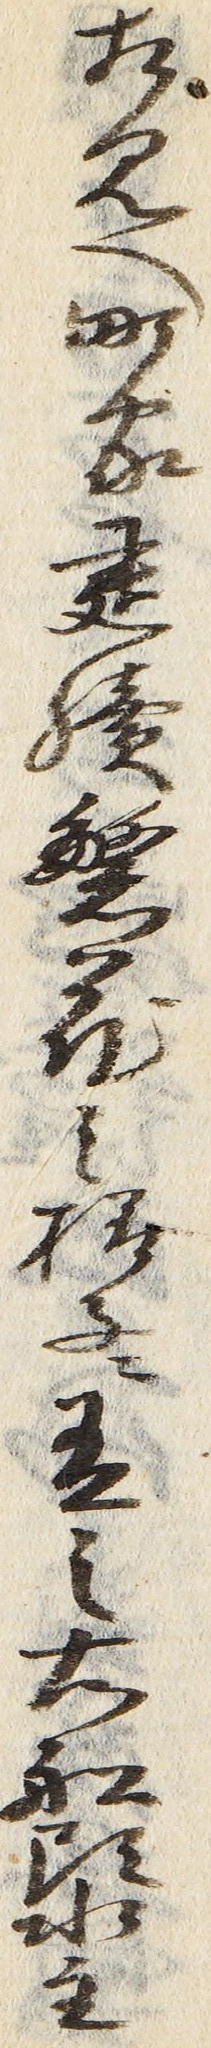相見へ町屋建ち續繁花之様子ニ有之右舩頭水主
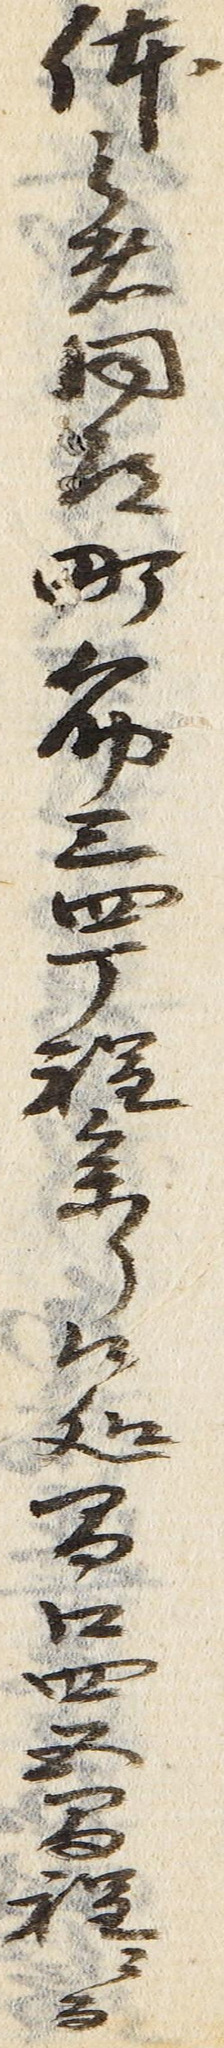体之者同道町筋三四丁程参り候処間口四五間程ニ而
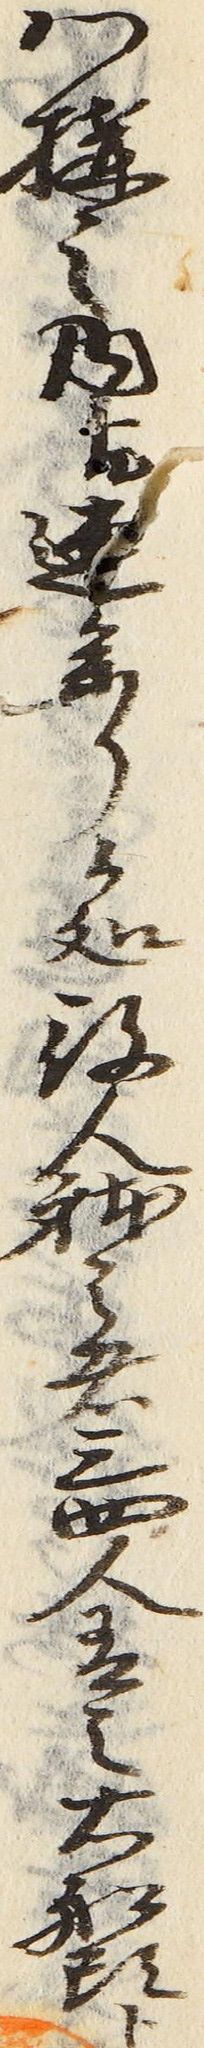門構之内江連参り候処役人体之者三四人有之右舩頭ト
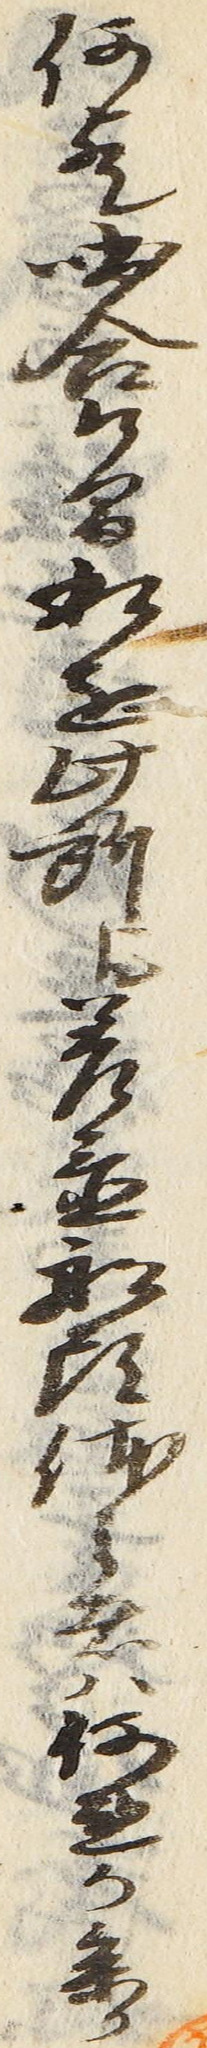何欤咄合候間私を此所江差置舩頭体之者ハ何れか参り
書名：漂流人善助聞書
